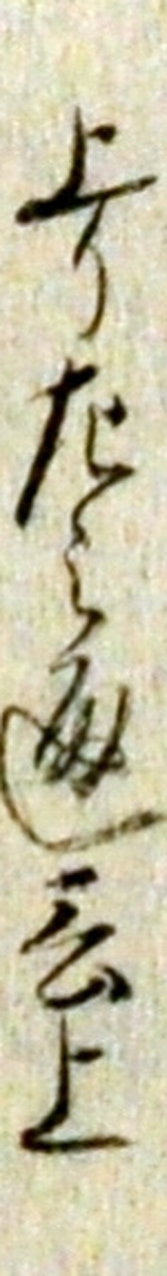上り左之通言上
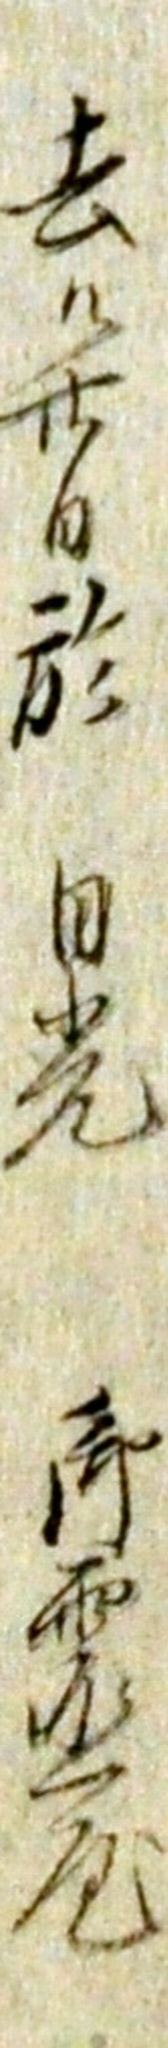去ㇽ廿日於日光御霊屋
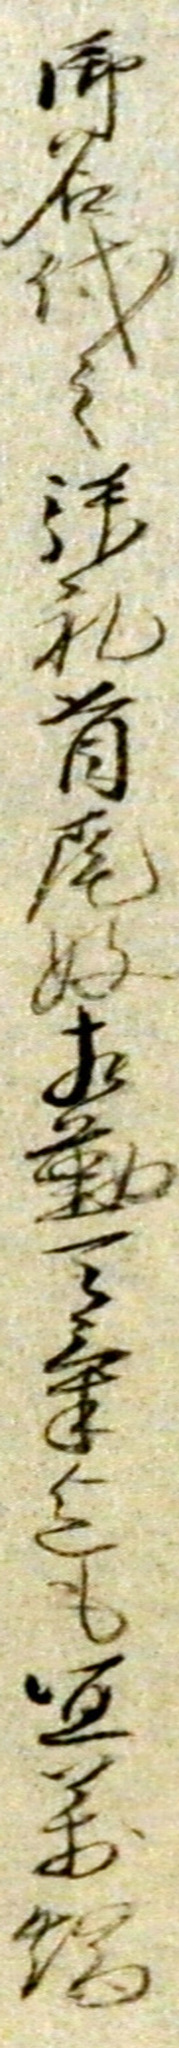御名代之拝礼首尾好相勤天気迄宜萬端
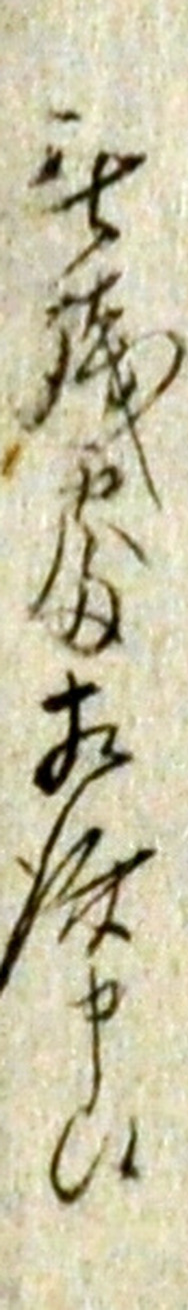無残處相済申候
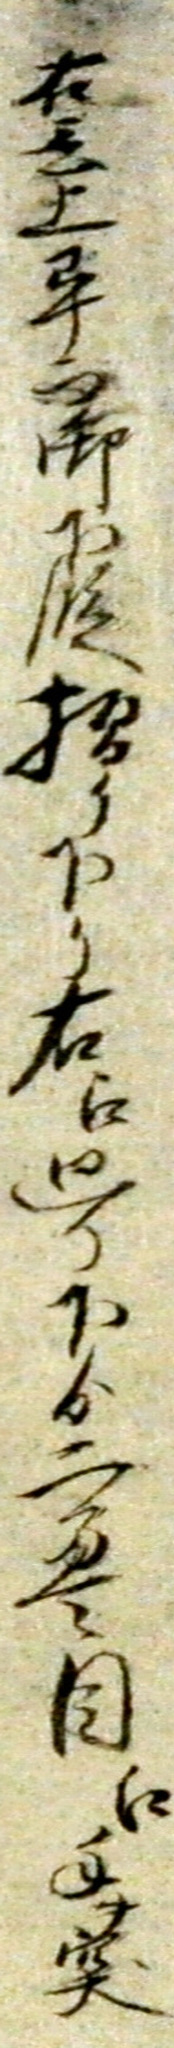右言上畢而御下段摺り下り右江廻り下ゟ二つ畳目江手ヲ突
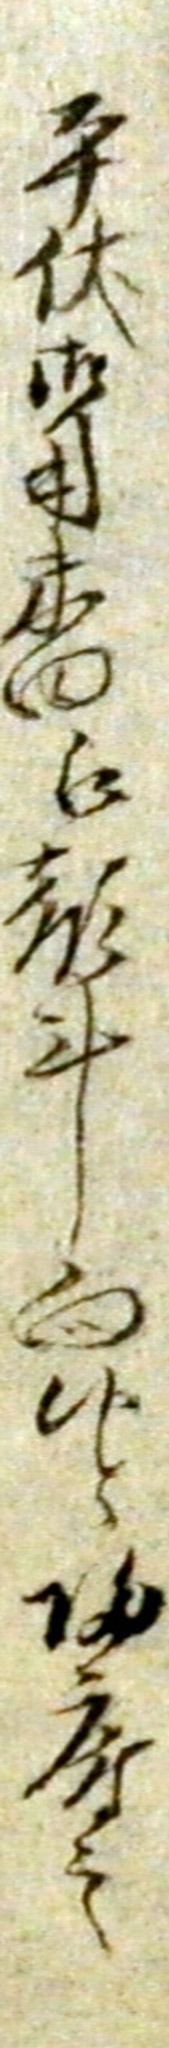平伏御用番江顔斗向候と帰府之
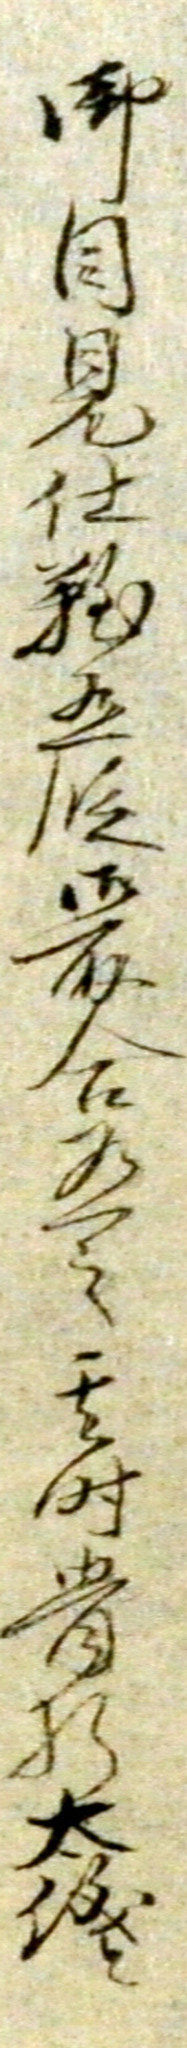御目見仕難有段御取合有之其時骨折太儀
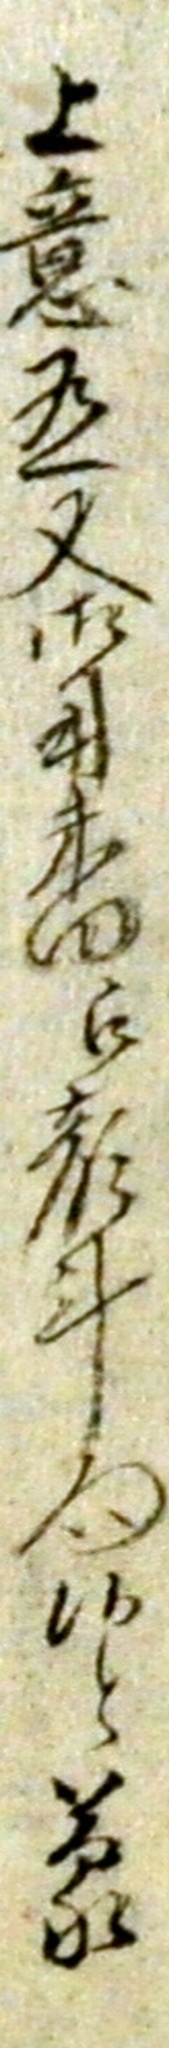上意有之又御用番江顔斗向候と蒙
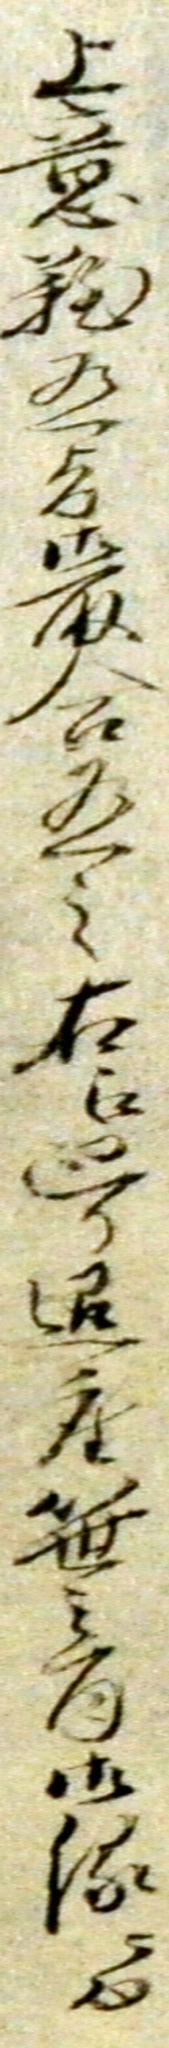上意難有旨御取合有之右江廻り退座笹之間御縁二而
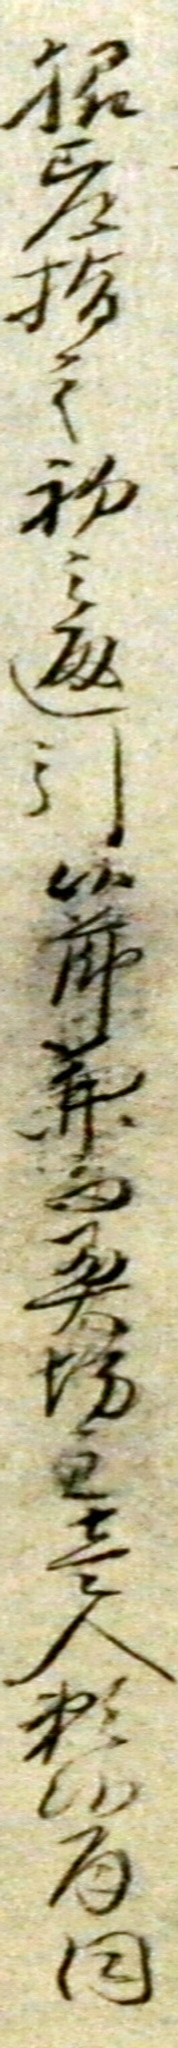脇差指之初之通引候節兼而奥坊主壱人頼候間同
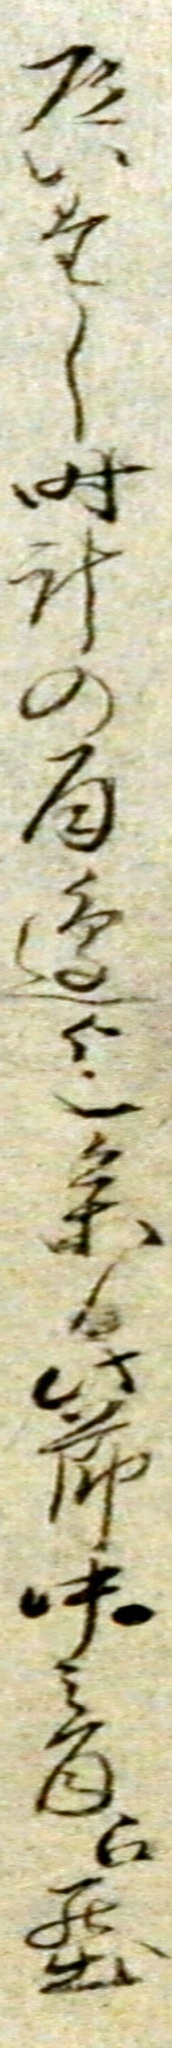道い堂し時計之間邊迄参り此節中之間江罷出
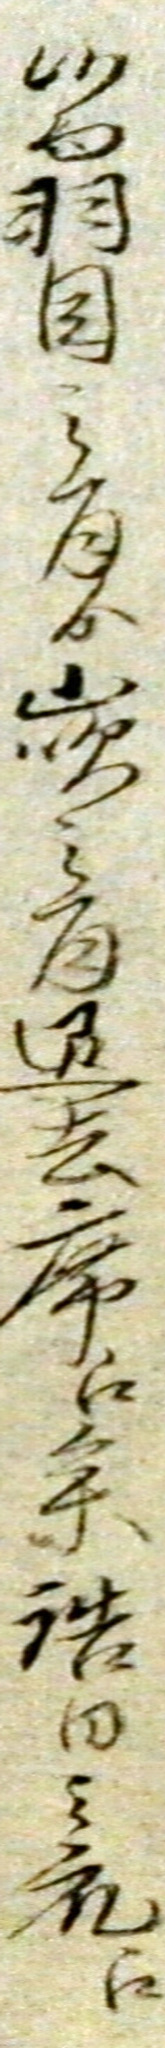候而羽目之間ゟ山吹之間退去席江参詰日之衆江
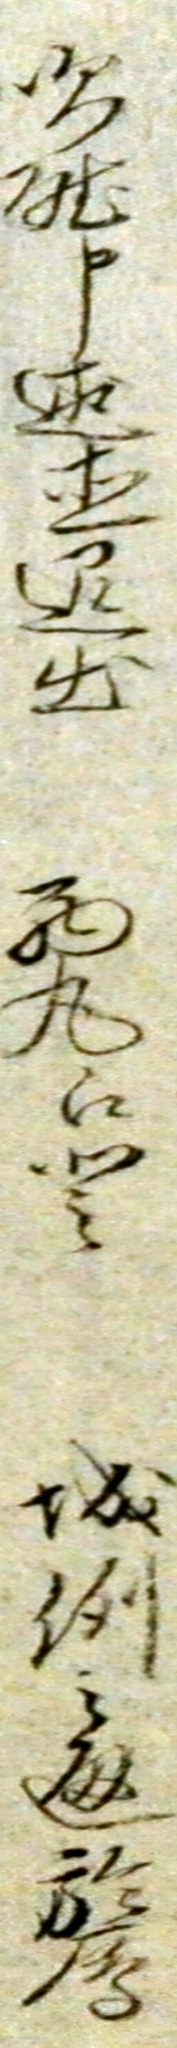吹聴申述直退出西丸江登城例之通於雁
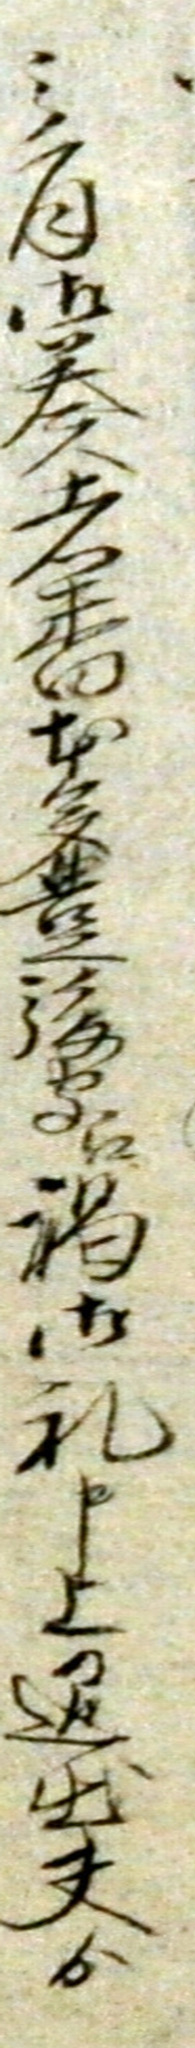之間御奏者番本多豊後守江謁御礼申上退出夫ゟ
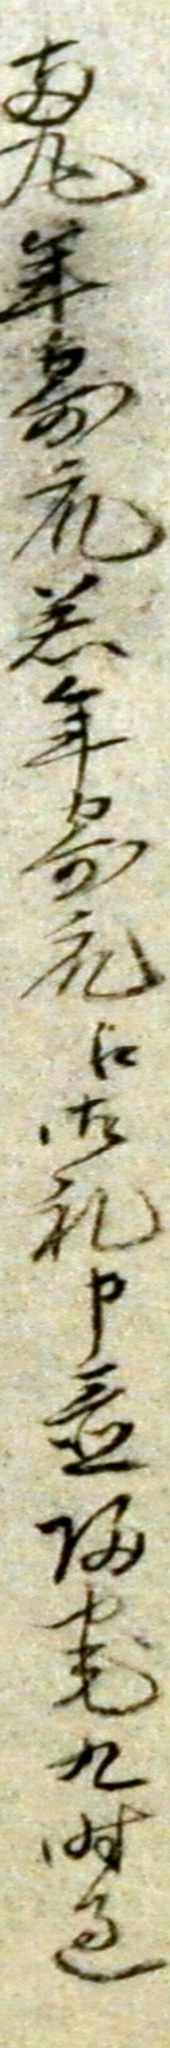西丸年寄衆若年寄衆江御礼申置帰宅九時過

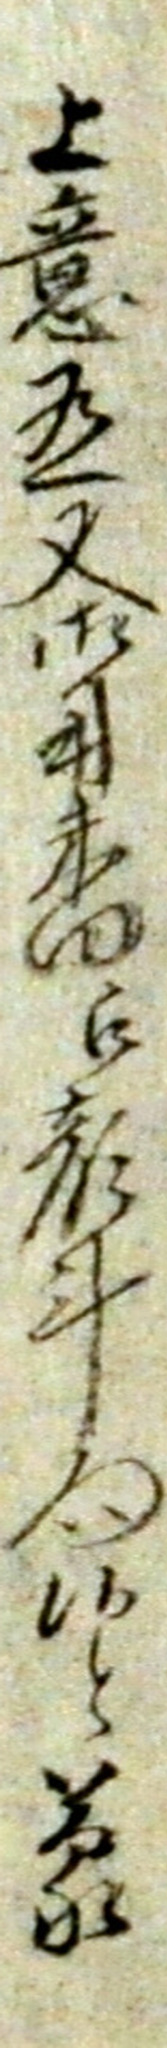上意有又御用番江顔斗向候と蒙
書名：日光御名代相勤候節ノ留
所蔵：伊那市立高遠町図書館・合同会社AMANE
